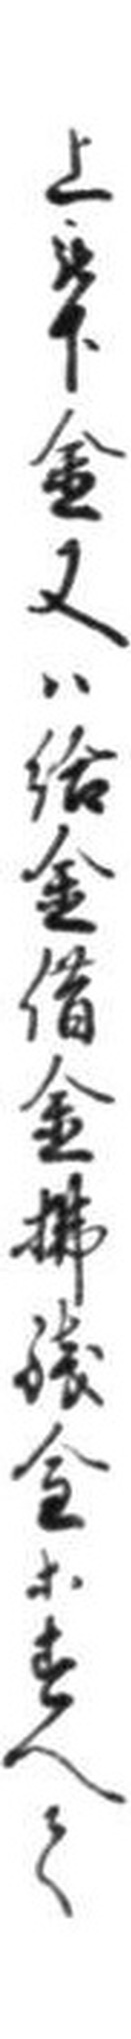上被下金又ハ給金借金払残金等すへて
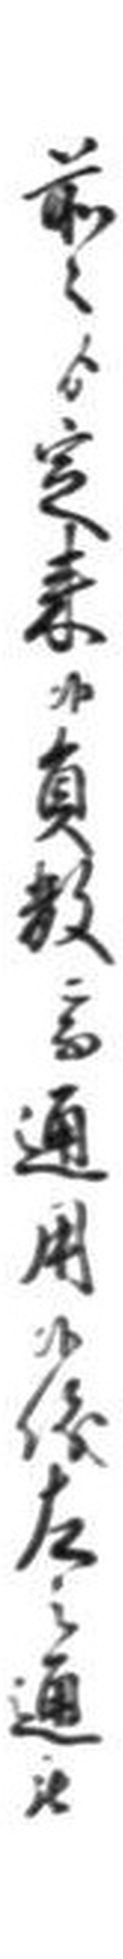前々ゟ定来候員数ニ而通用候儀左之通被
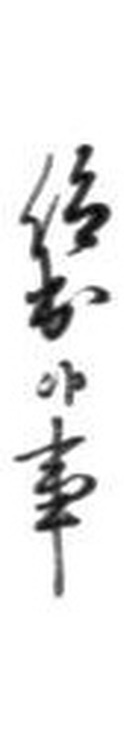仰出候事
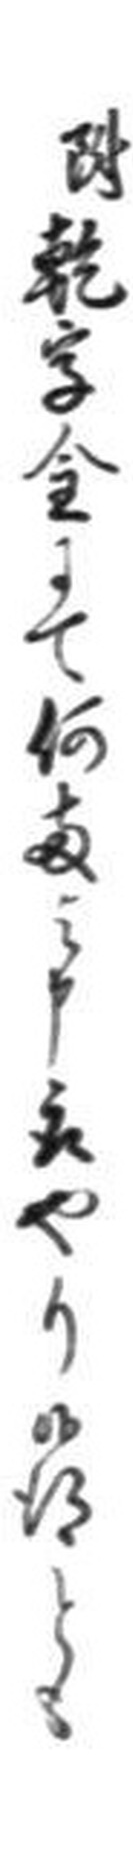付乾字金にて何両与申取やり候得とも
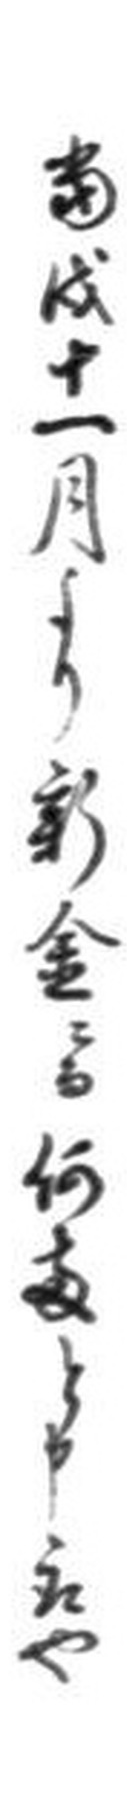当戌十一月より新金ニ而何両と申取や
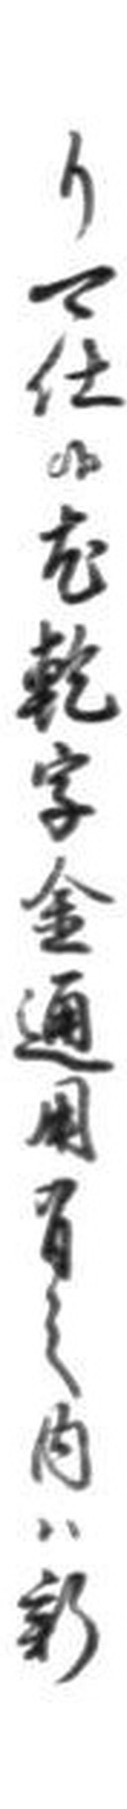り可仕候尤乾字金通用有之内ハ新
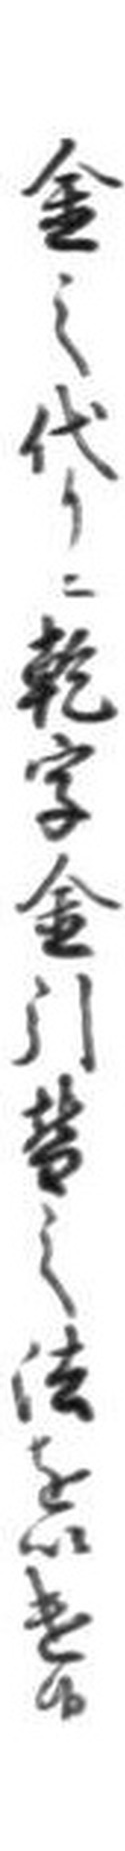金之代りニ乾字金引替之法を以遣候
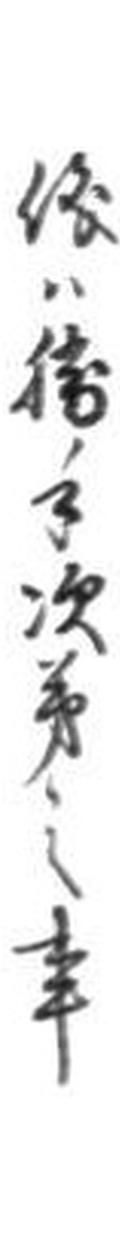儀ハ勝手次第之事
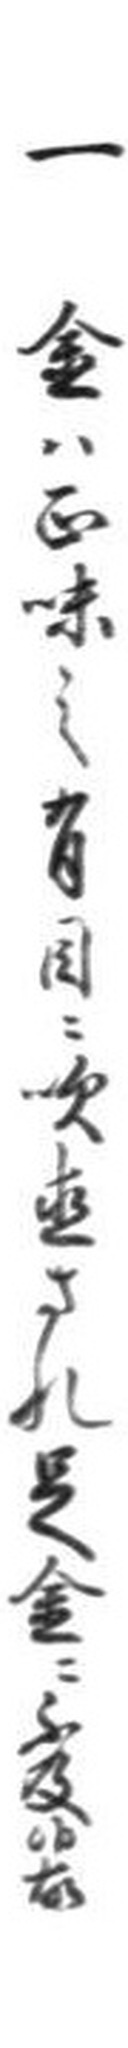一金ハ正味之有目ニ吹直され足金ニ不及候故
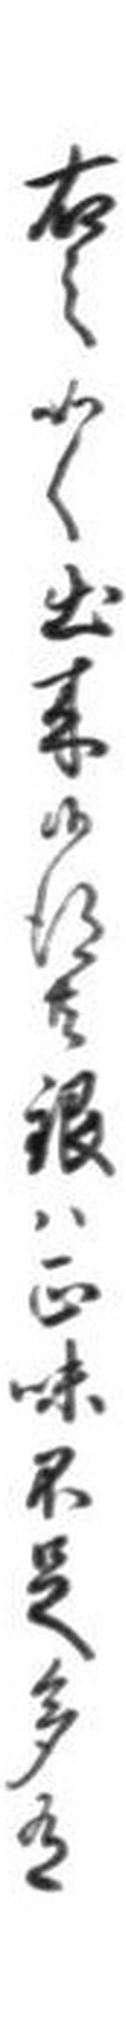右之如く出来候得共銀ハ正味不足多有

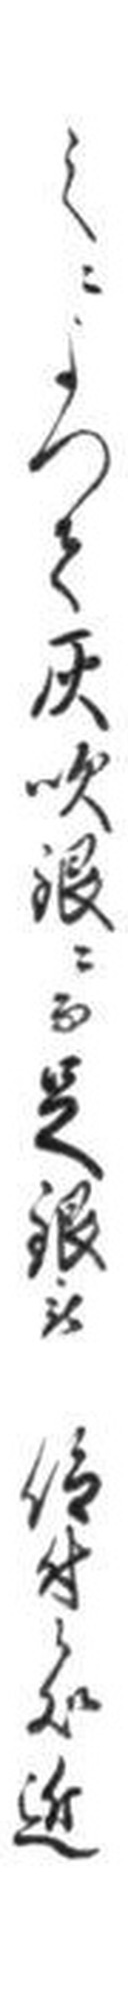之ニよつて灰吹銀ニ而足銀被仰付候処近
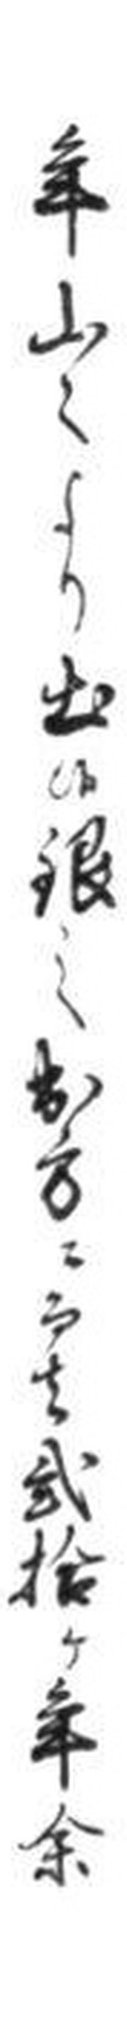年山々より出候銀之出方ニ而者弐拾ケ年余
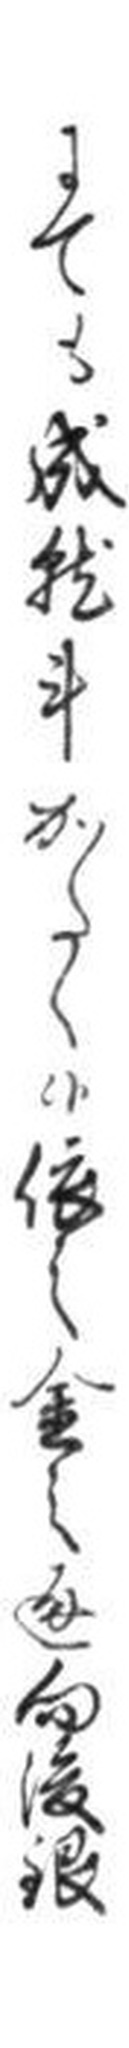にても成就計かたく候依之金之通向後銀
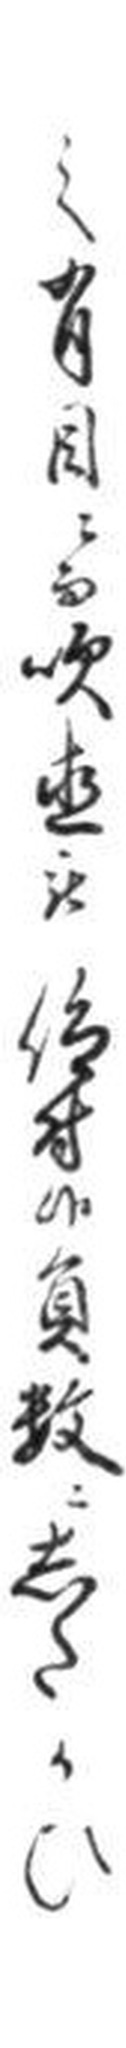之有目ニ而吹直被仰付候員数ニしたかひ
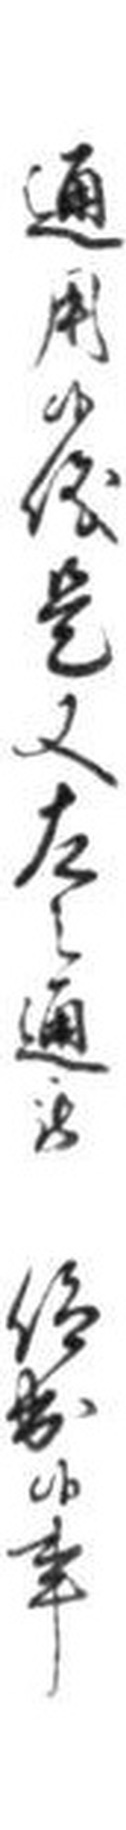通用候儀是又左之通被仰出候事
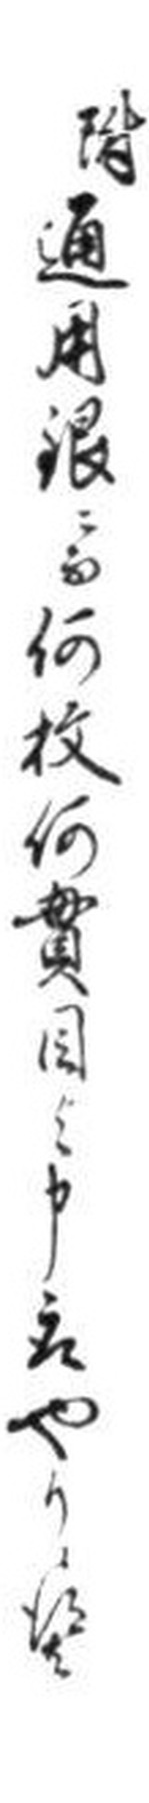付通用銀ニ而何枚何貫目与申取やりニ候得共
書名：家譜 三十二 吉邦公 従享保二年到享保三年
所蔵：福井県文書館 Fukui Prefectural Archives
